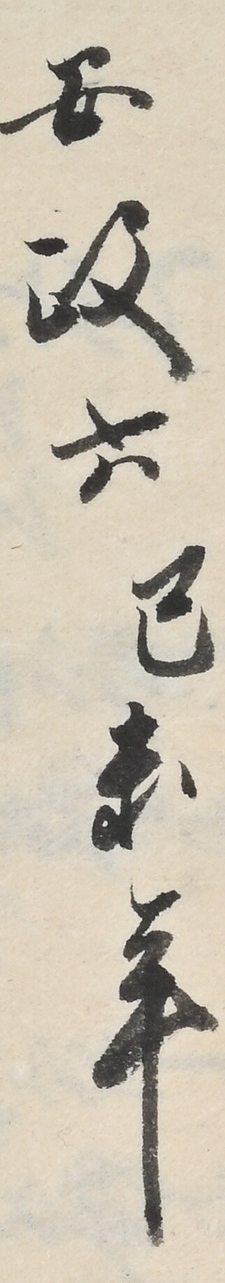㊞安政六己未年
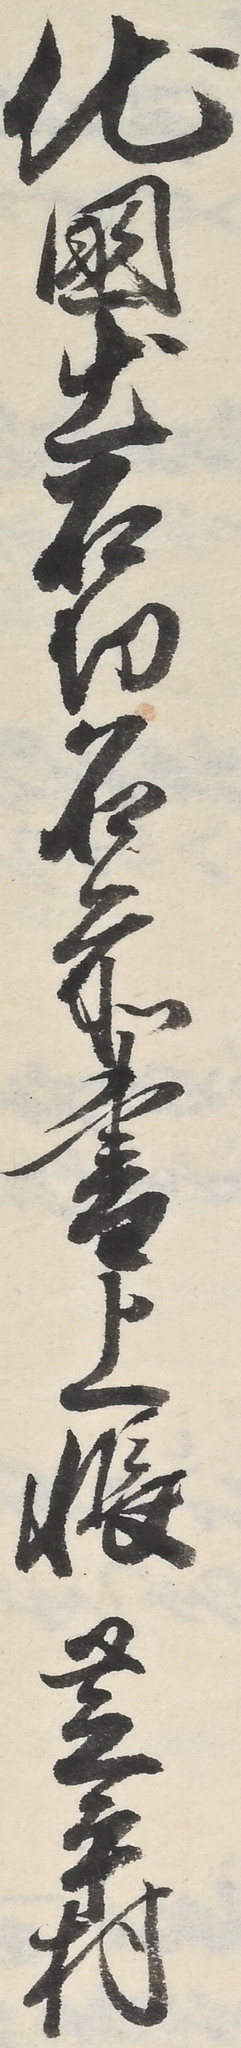他国出石切名前書上帳芝平村

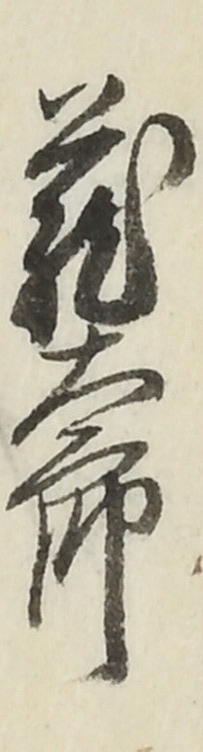蔵太郎
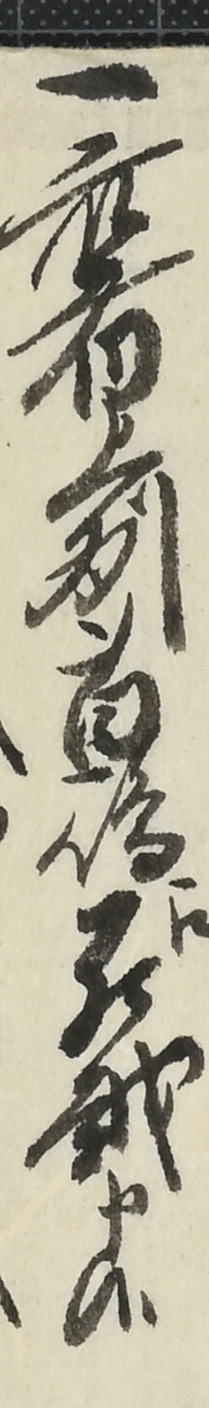一此者上州高嶋江罷越申候
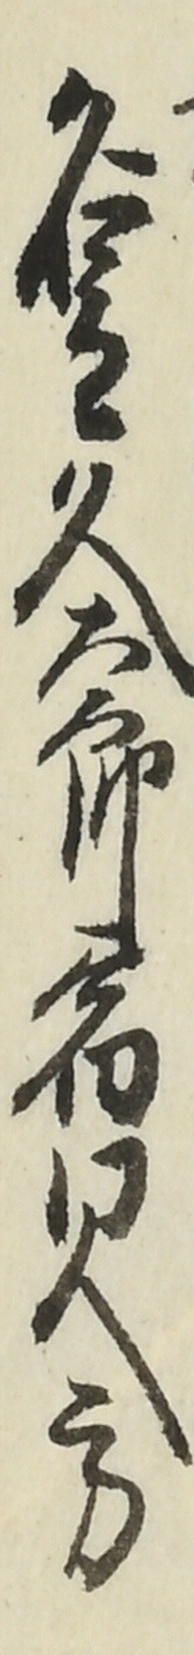名主久太郎宿同人方
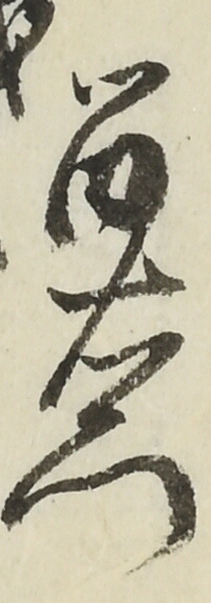留右衛門
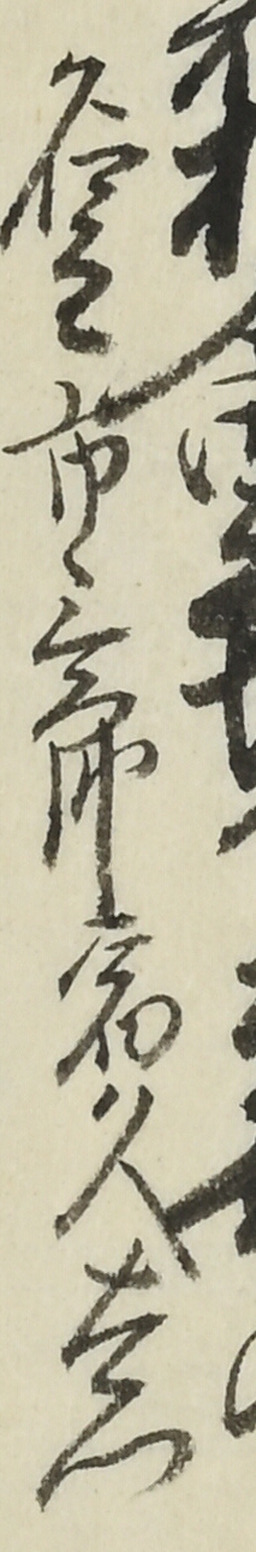名主市三郎宿久左衛門
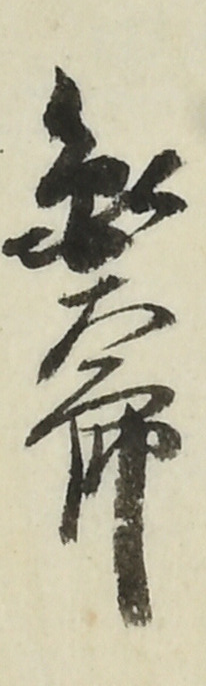蔵太郎
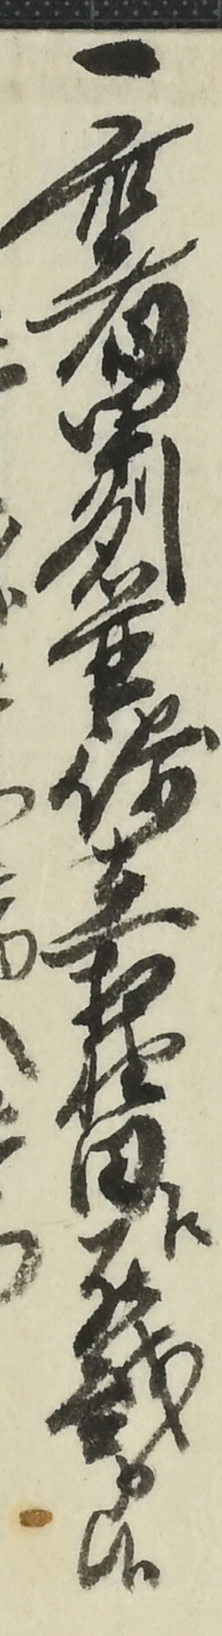一此者甲州韮崎在相野田江罷越申候
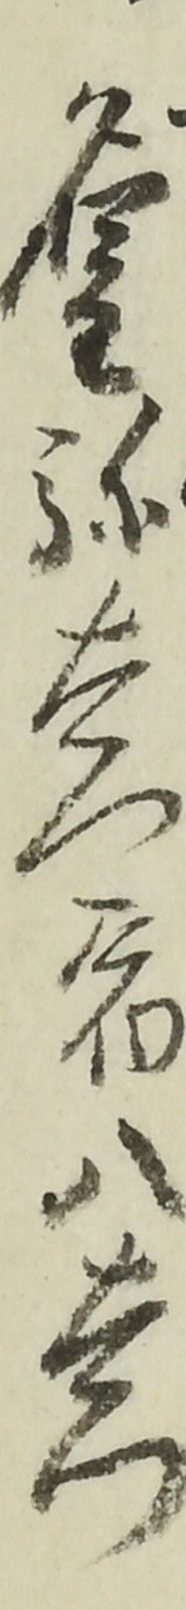名主弥左衛門宿八左衛門

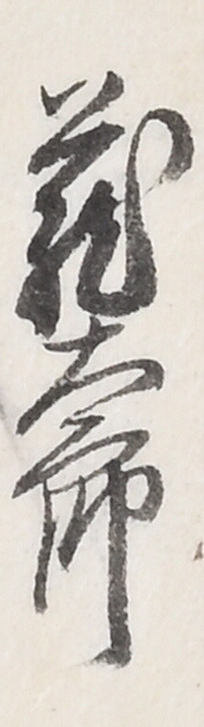蔵太郎
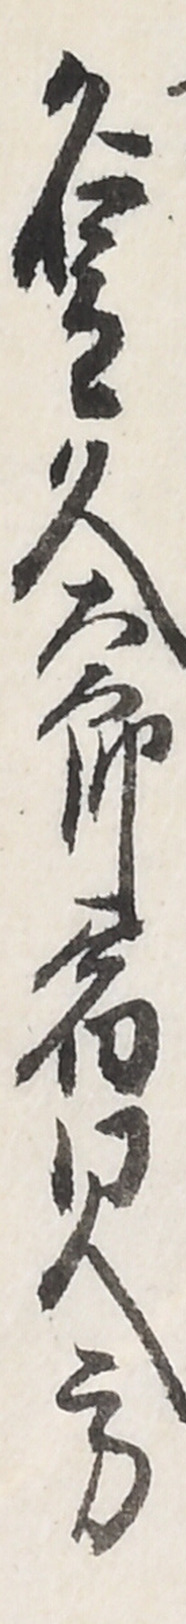名主久太郎宿同人方
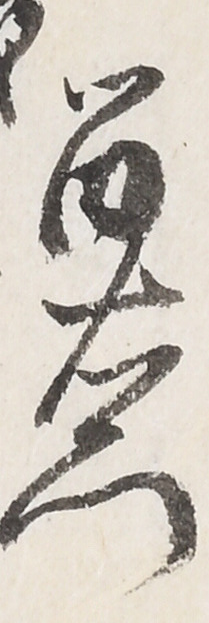留右衛門
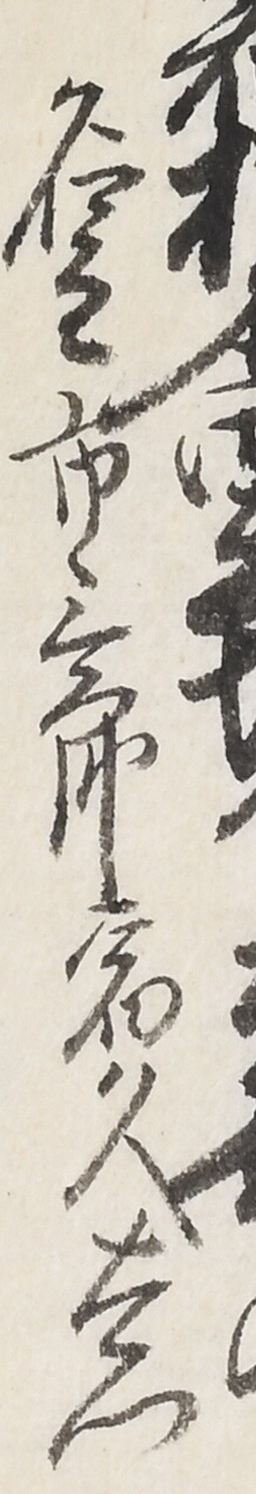名主市三郎宿久左衛門
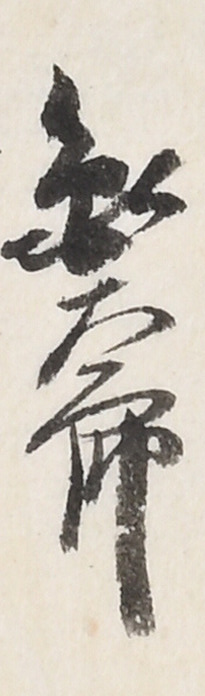蔵太郎
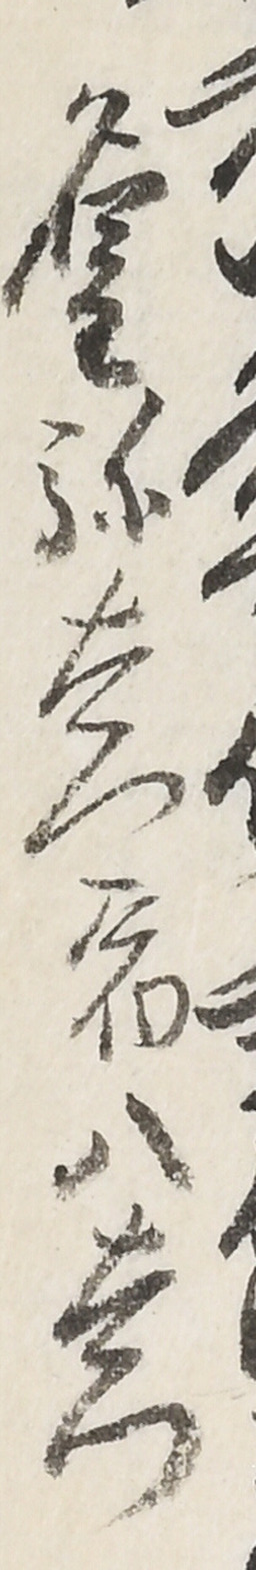名主弥左衛門宿八左衛門
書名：安政六己未年正月他國出石切名前書上帳
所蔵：伊那市立高遠町図書館・合同会社AMANE
